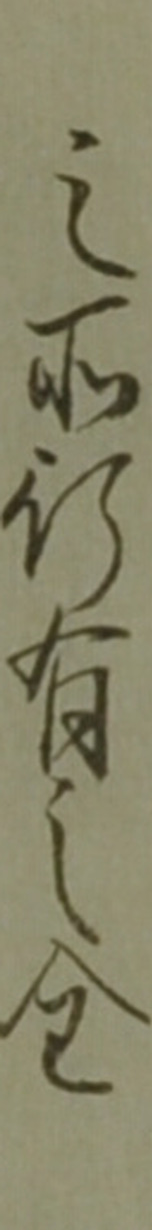之所行有之全
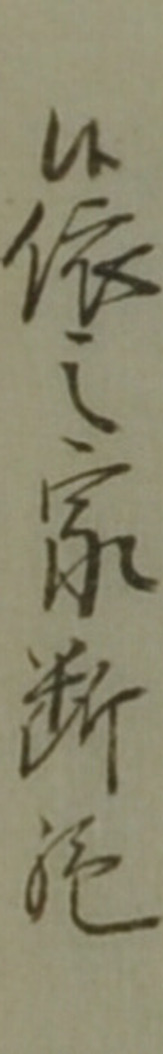候依之家断絶
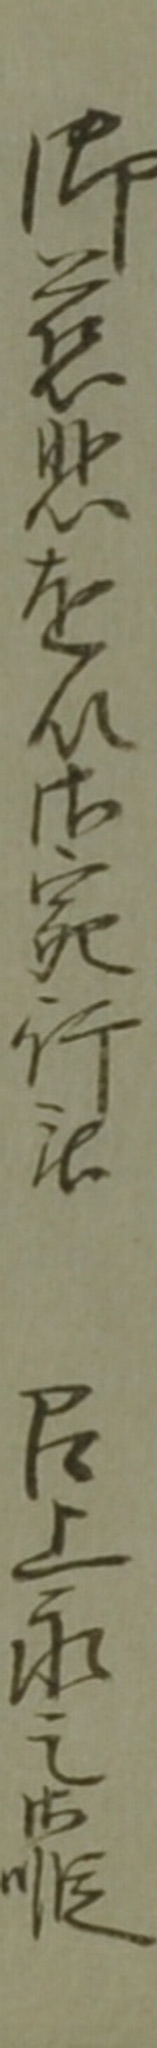御慈悲を以御宛行被召上永之御暇
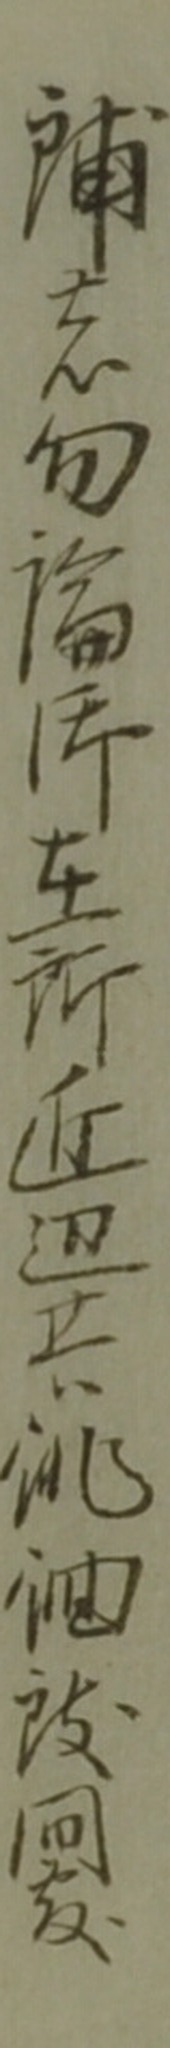鋪者勿論御在所近辺共徘徊致間敷
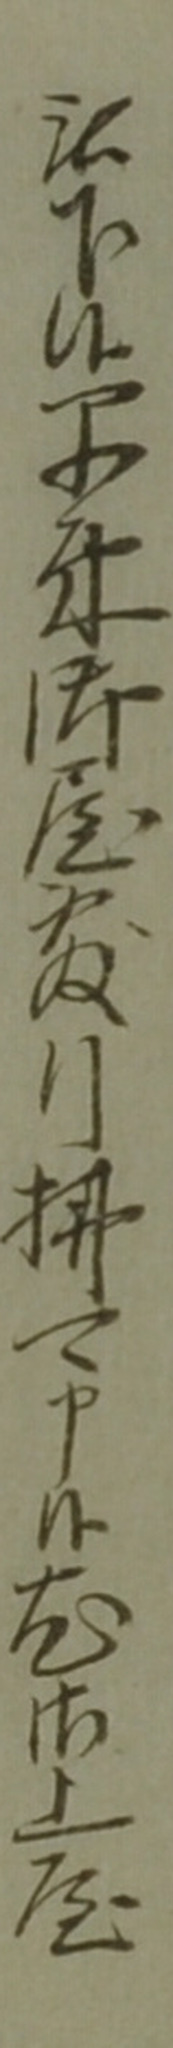被下候早◻︎御屋敷引掛可申候尤御上屋
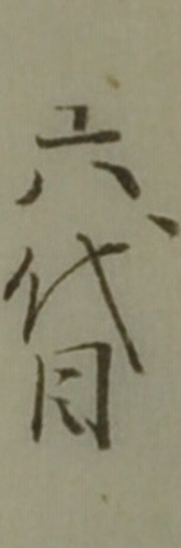六代目
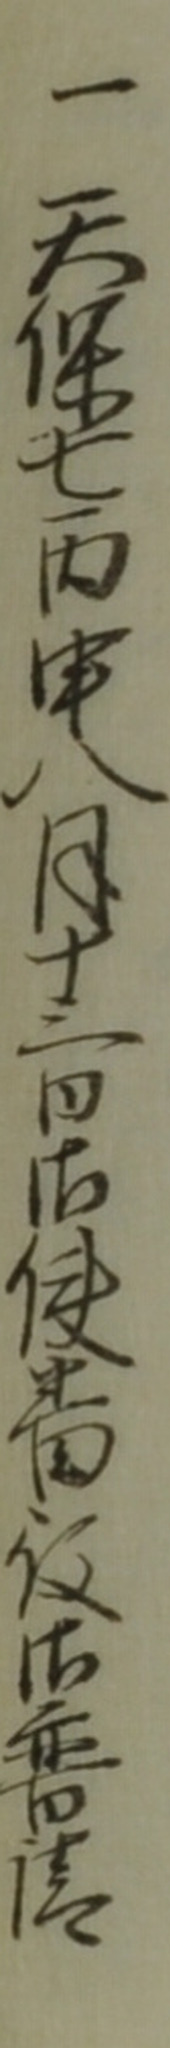一天保七丙申八月十三日御使番役御普請
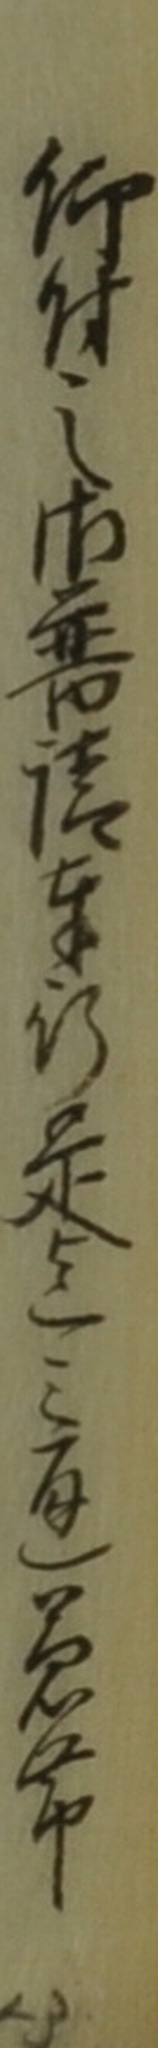仰付之御普請奉行是迄之通兼帯
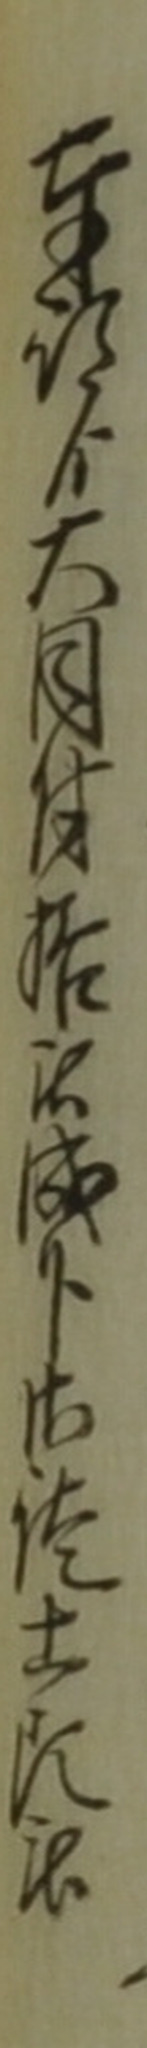奉行ゟ大目付格被成下御徒士頭被
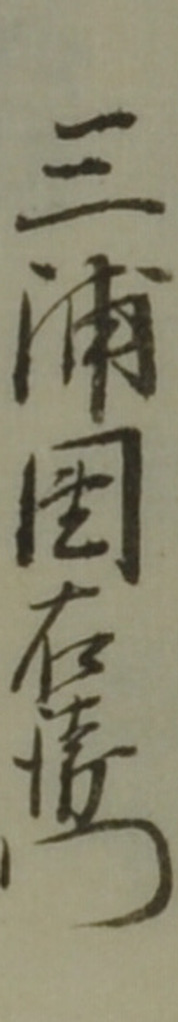三浦国右衛門
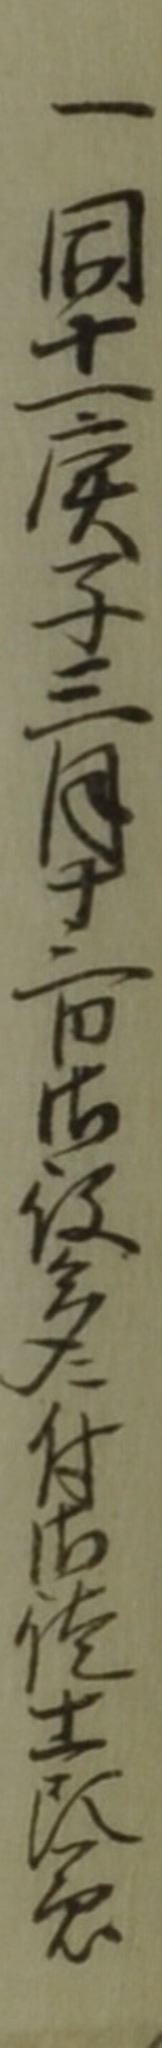一同十一庚子三月十二日御役多ニ付御徒士頭兼
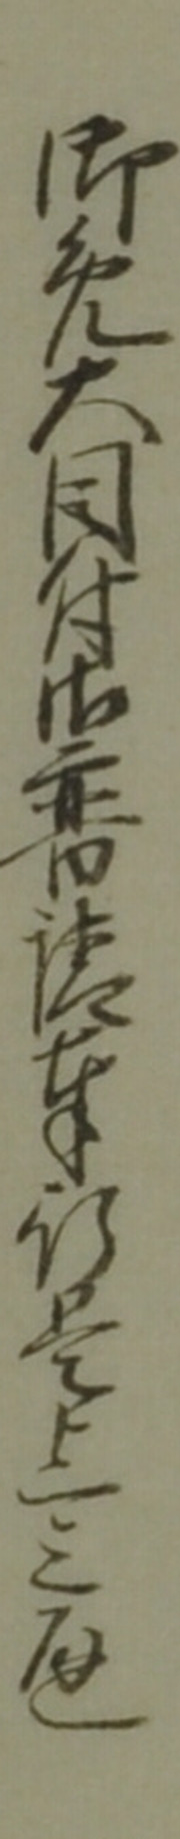御免大目付御普請奉行是迄之通
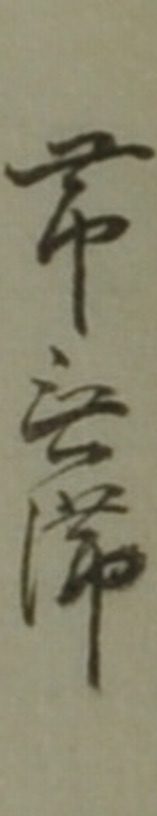帯無滞
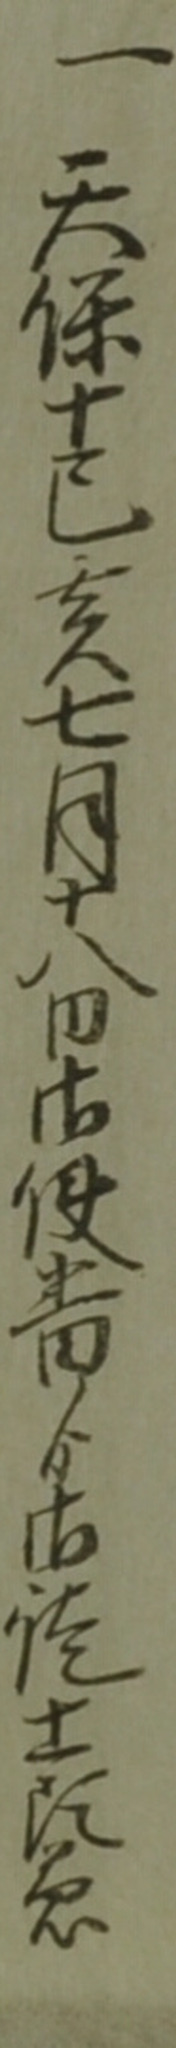一天保十己亥七月十八日御使番ゟ御徒士頭兼
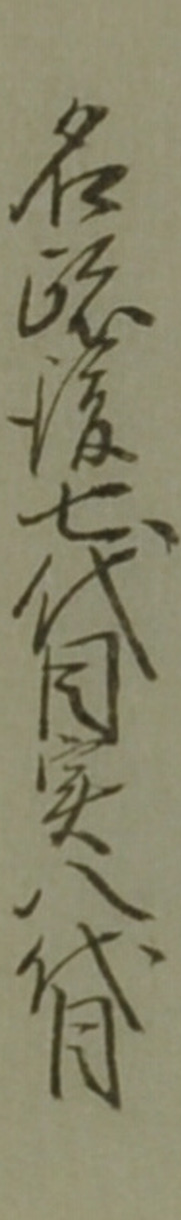名跡後七代目実八代目
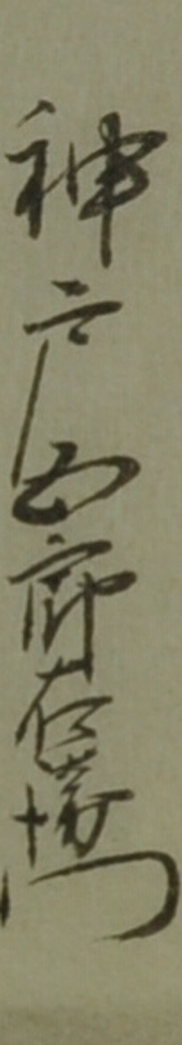神戸五郎右衛門
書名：諸御役代々録（六）
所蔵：伊那市立高遠町図書館・合同会社AMANE
